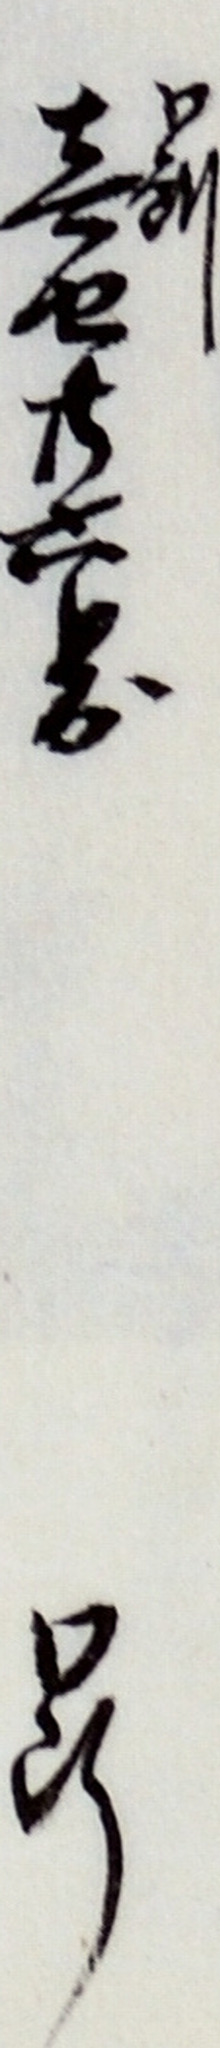壱セ廿六歩同断
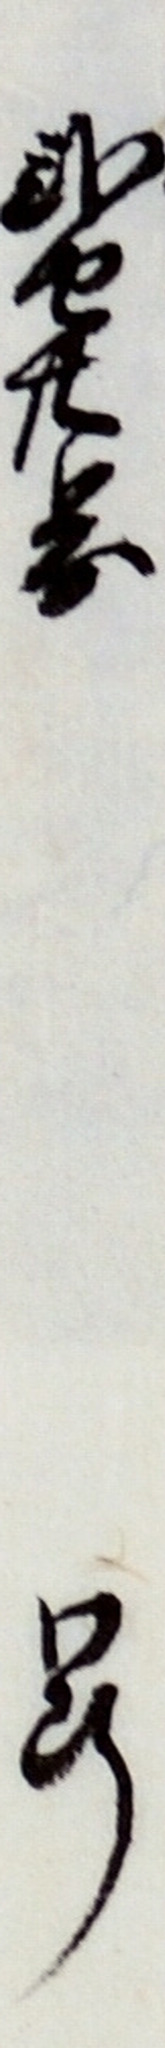弐セ廿歩同断
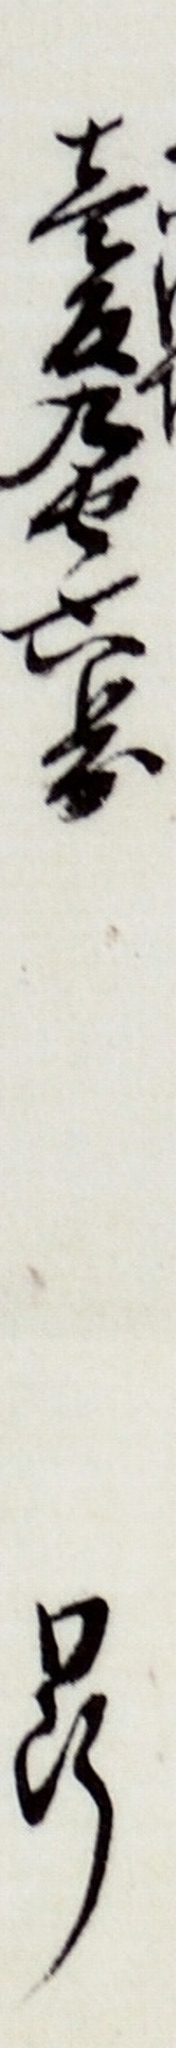壱反九セ六歩同断
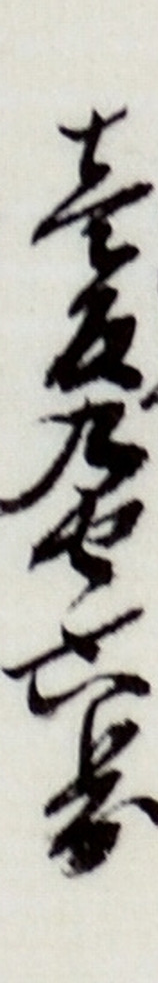壱反九セ六歩同断
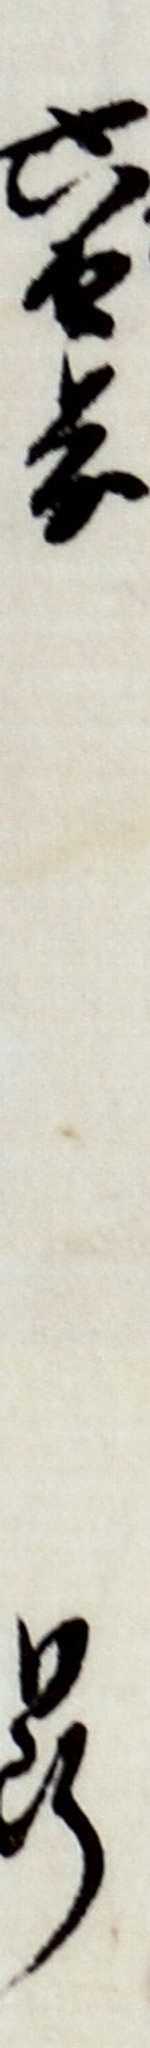六セ歩同断
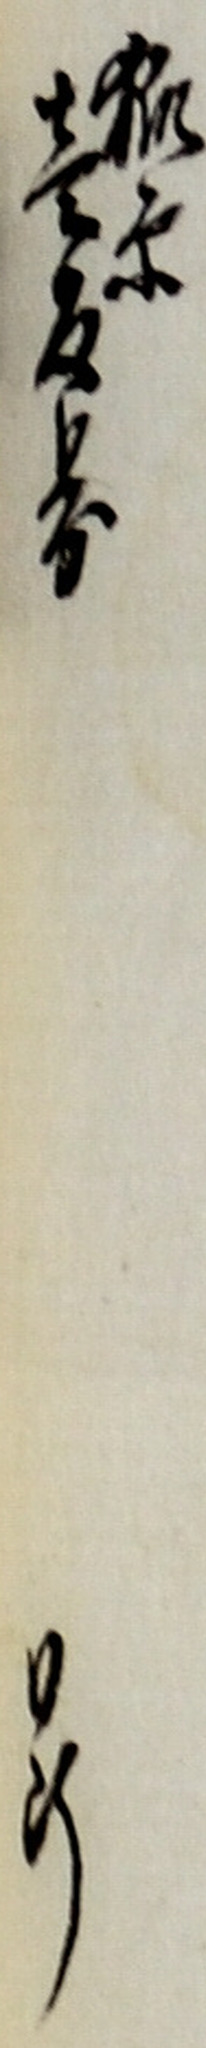壱反歩同断
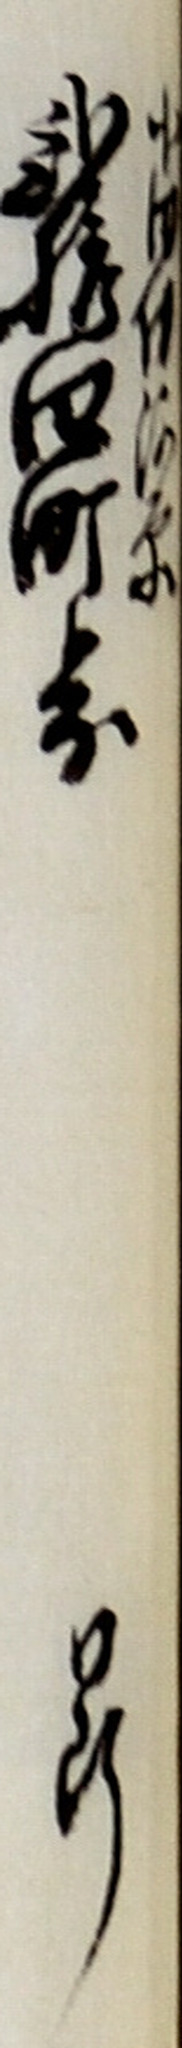弐拾四町歩同断
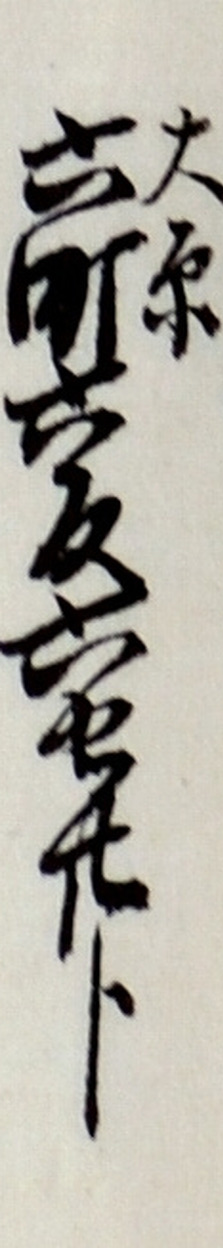六町六反六セ廿歩同断
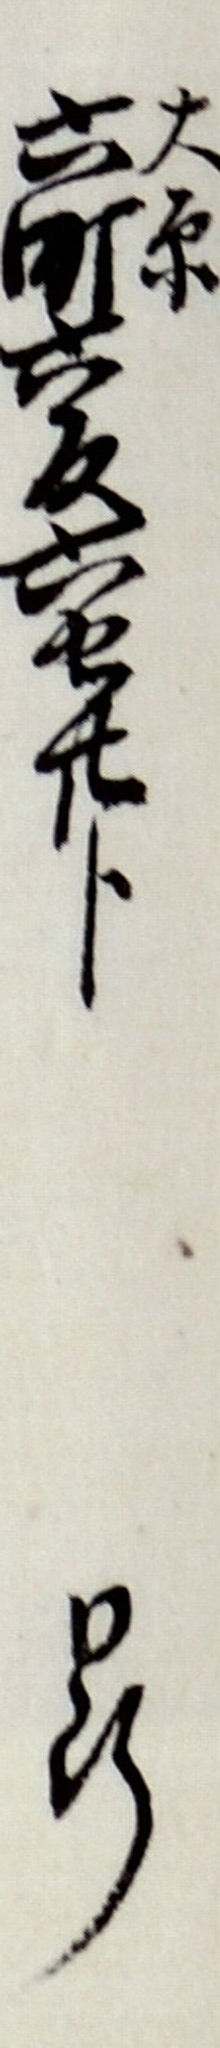六町六反六セ廿歩同断
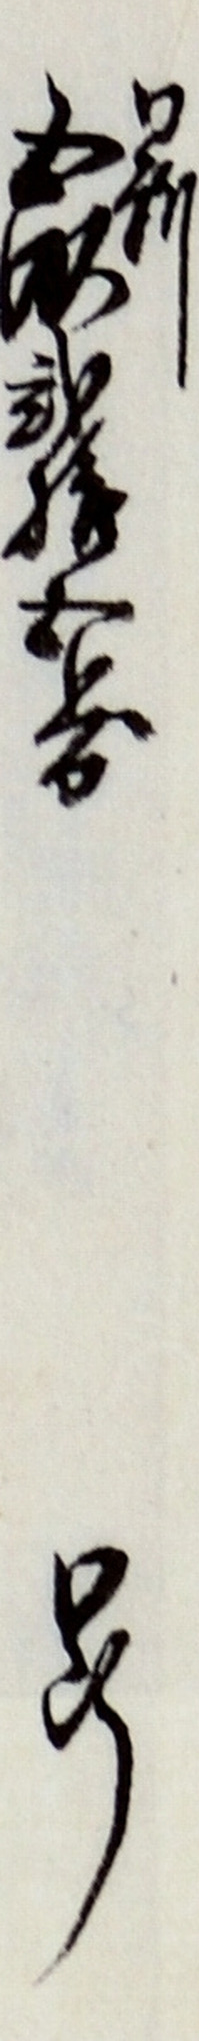五畝弐拾五歩同断
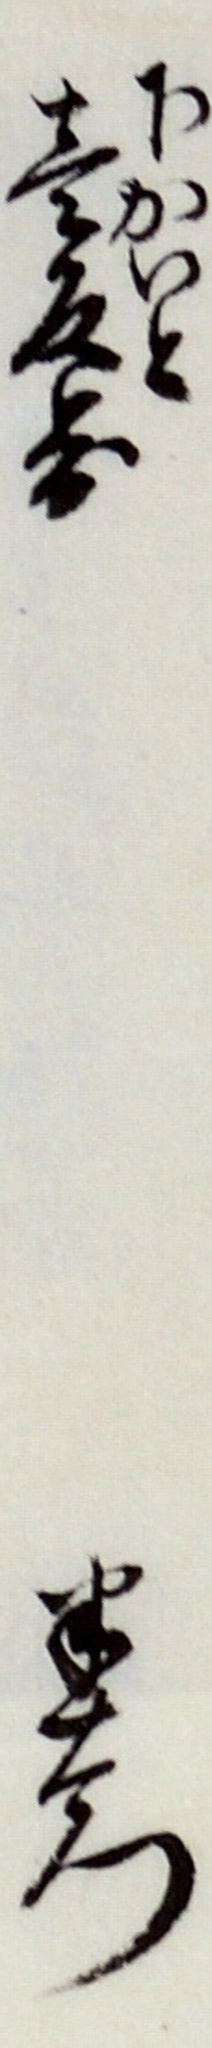壱反歩半右衛門
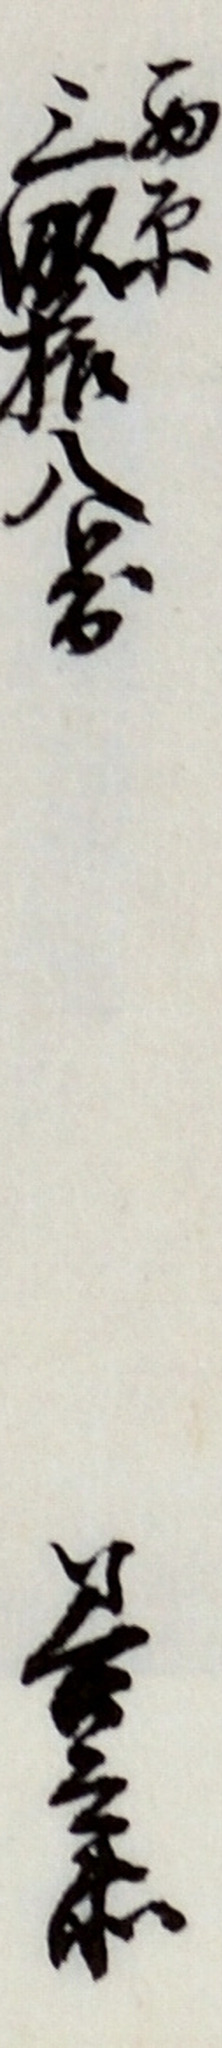三畝拾八歩善兵衛
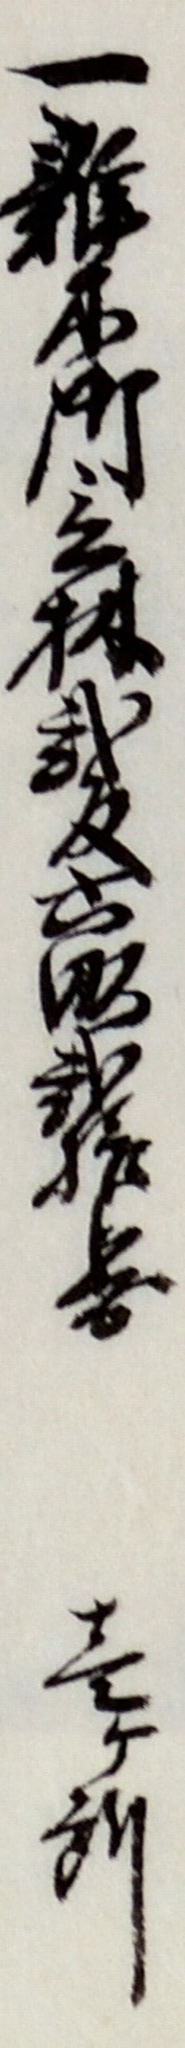一雑木内立林弐反六畝弐拾歩壱ケ所
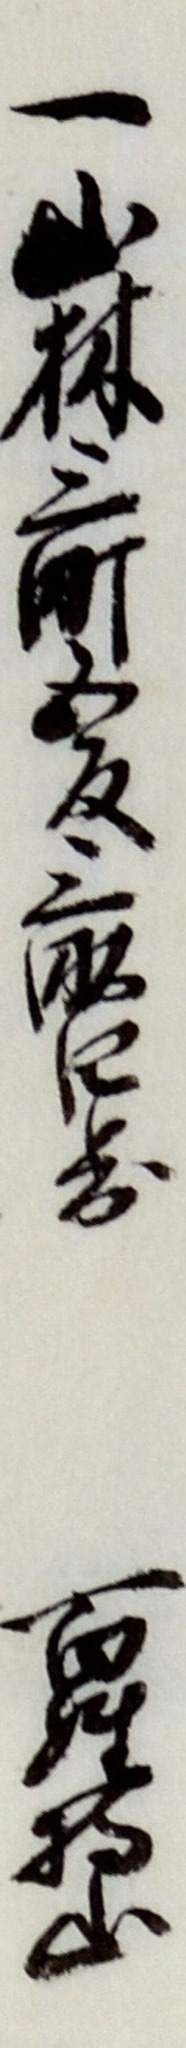一山林三町五反三畝四歩百姓持山
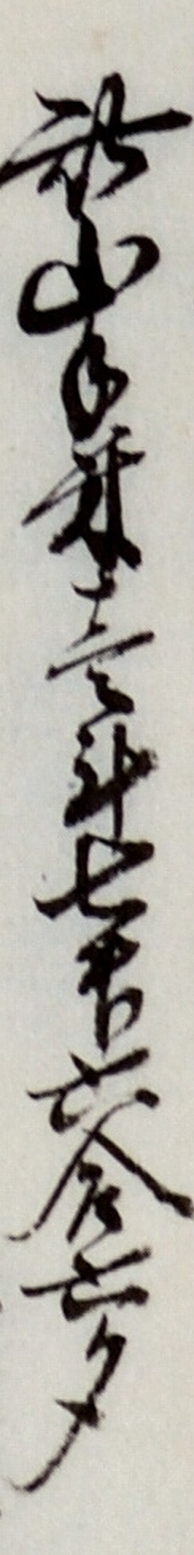此山手米壱斗七升六合六勺
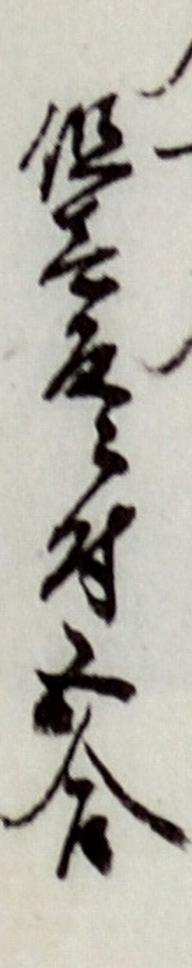但壱反ニ付五合
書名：御領分中山林社地手控
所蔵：伊那市立高遠町図書館・合同会社AMANE
